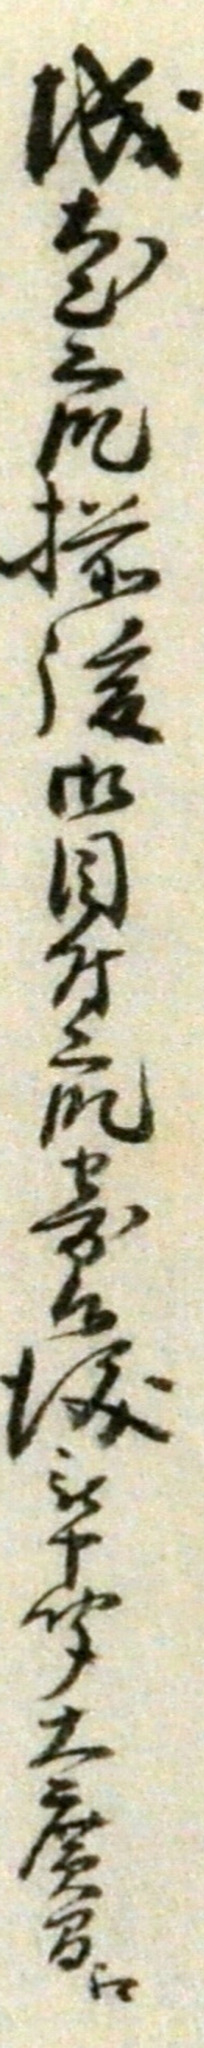城老衆揃後御目付衆寄候儀被申聞大廣間え
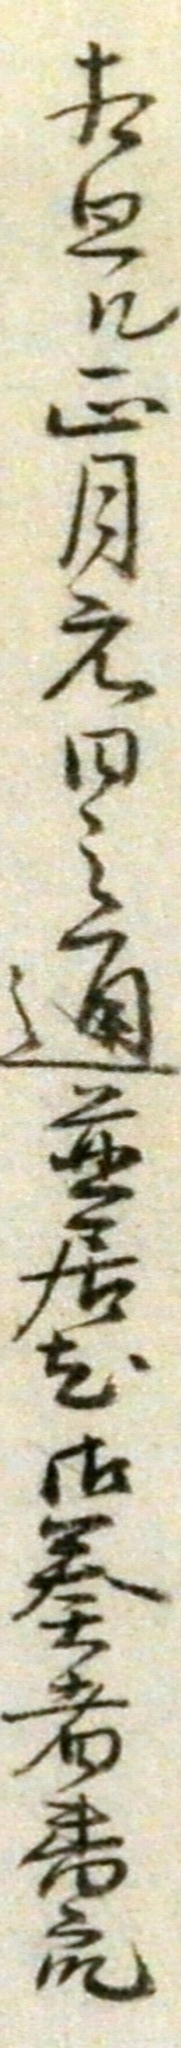相廻ル正月元日之通並居尤御奏者番衆
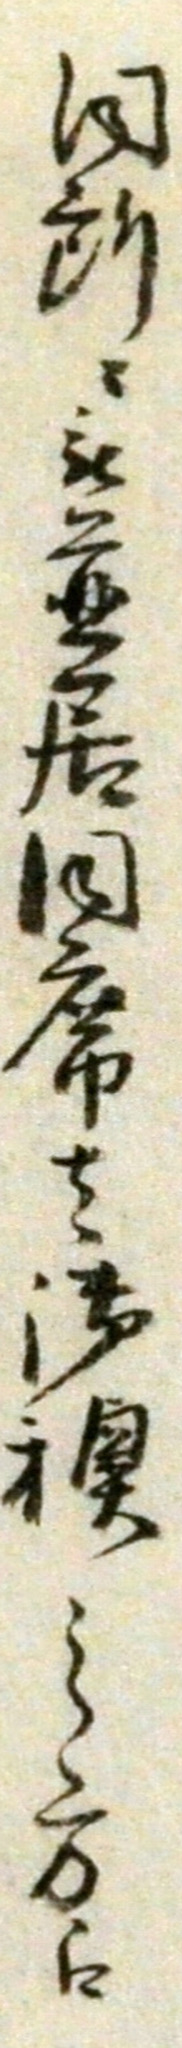同所ニ被並居同席は御襖之方え
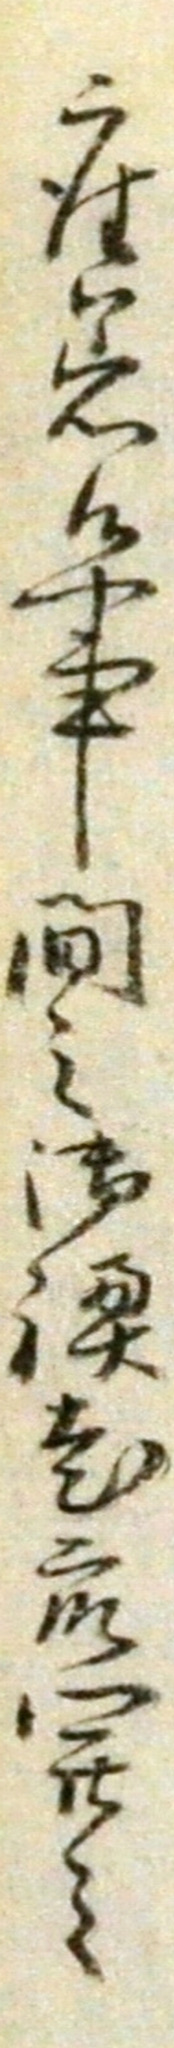座着候事間之御襖老衆開之
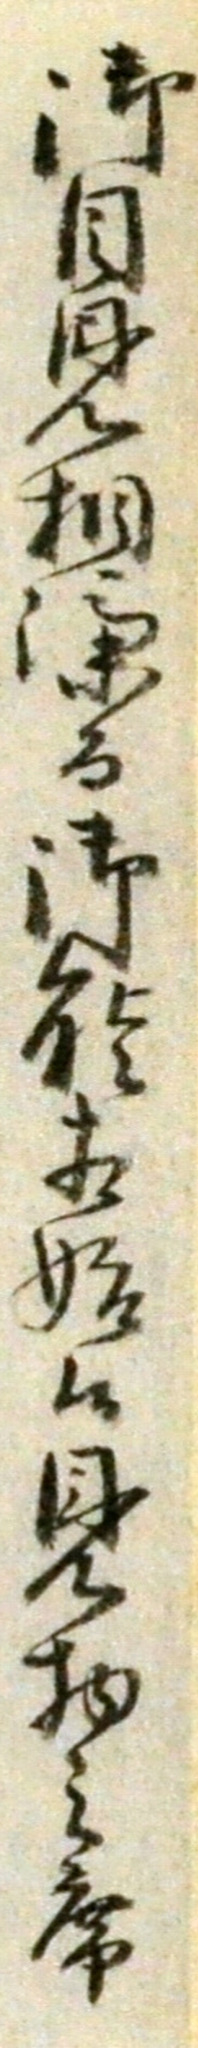御目見相済而御能相始候見物之席
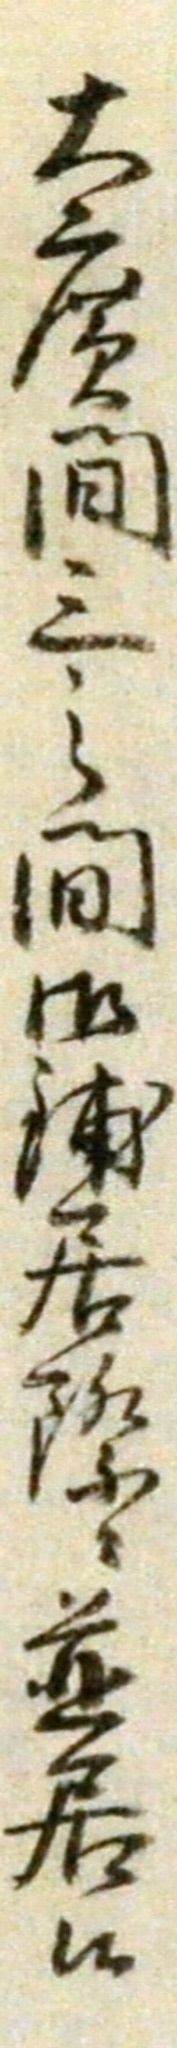大廣間三之間御鋪居際ニ並居候
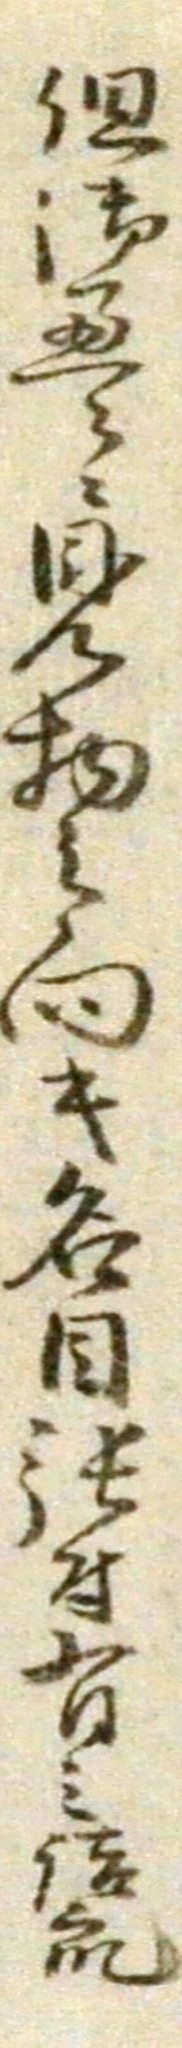但御畳ニ見物之向キ名目張付有之諸衆
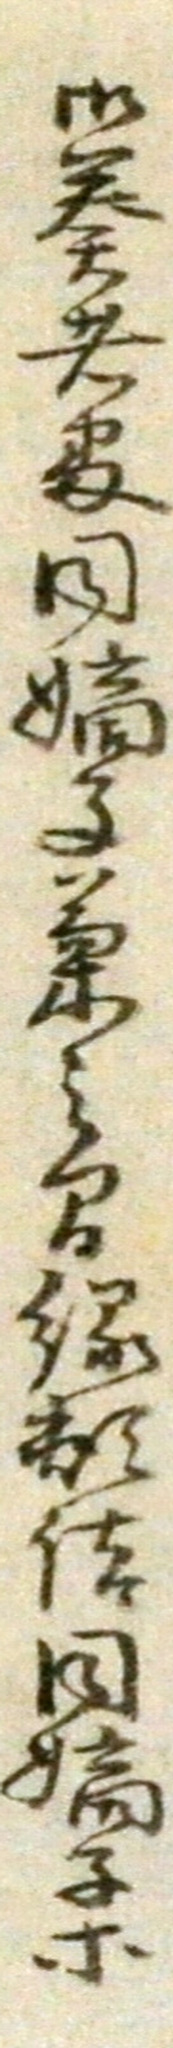御奏者番同嫡子菊之間縁頬詰同嫡子等
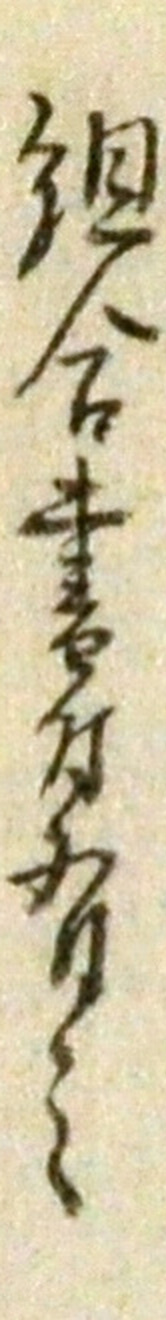組合書付有之
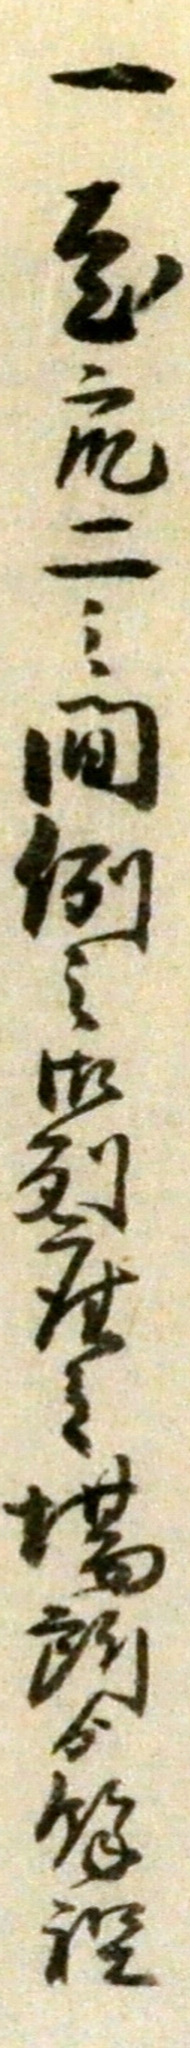一老衆ニ之間例之御列座之場所ゟ餘程
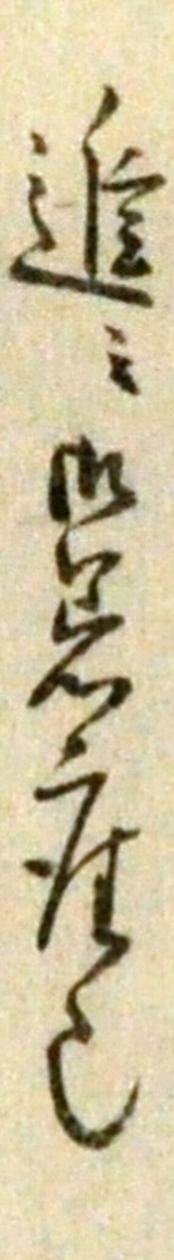進ミ御着座也
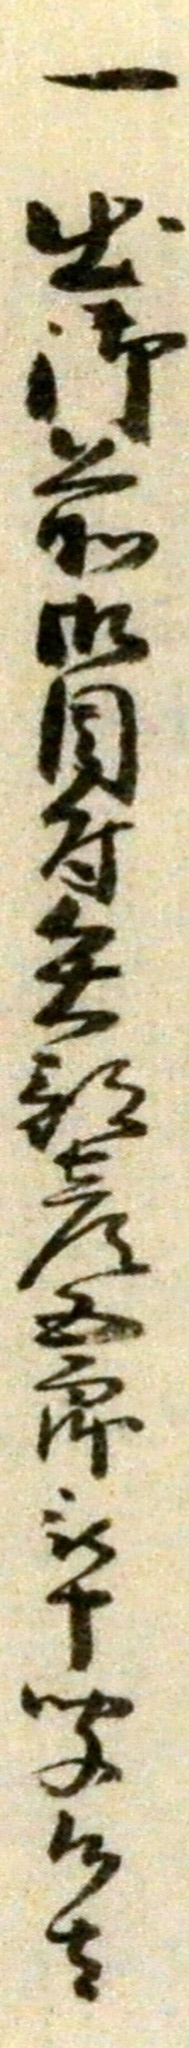一出御前御目付矢部彦五郎被申聞候は
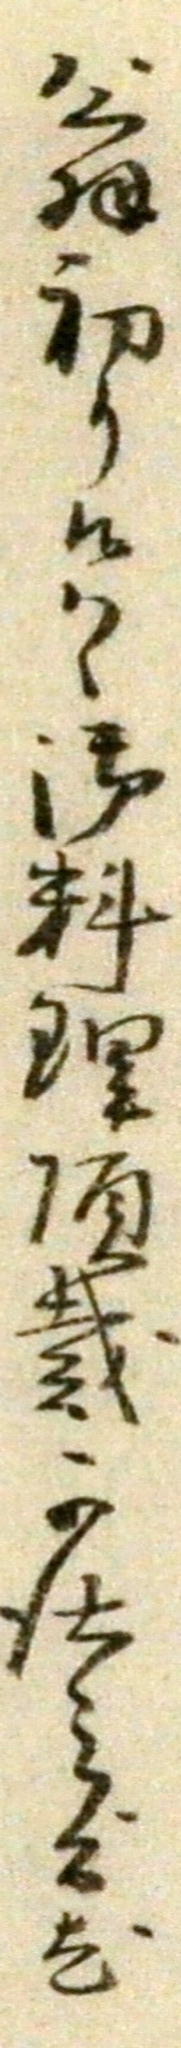翁始り候ハゝ御料理頂戴可仕之旨尤
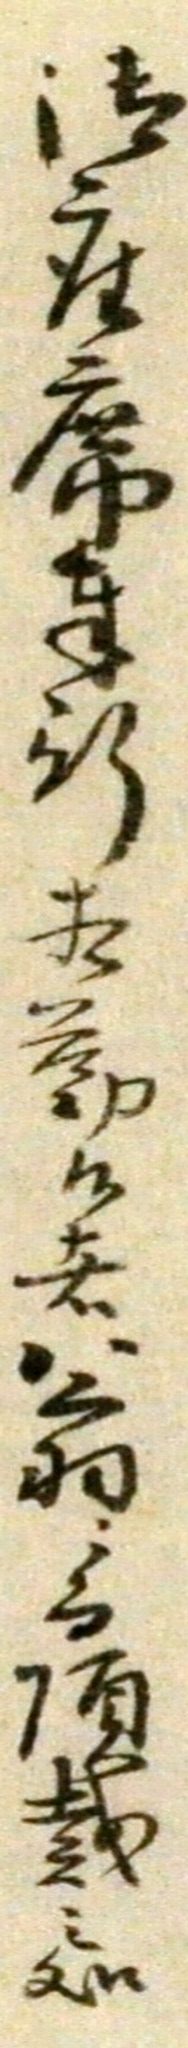御座席奉行相勤候者翁ニ而頂戴之処
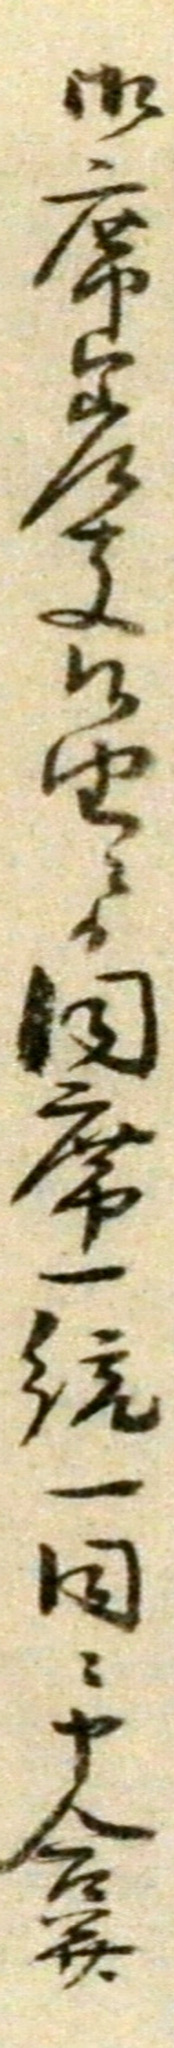御席差支候由ニ而同席一統一同ニ申合并
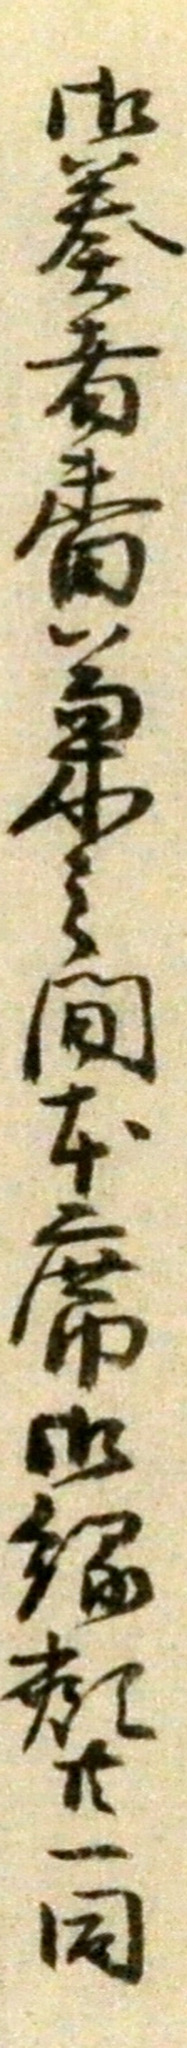御奏者番菊之間本席御縁頬共一同
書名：若君様（家斉嫡男）誕生諸祝儀ノ節ノ留書外
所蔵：伊那市立高遠町図書館・合同会社AMANE
